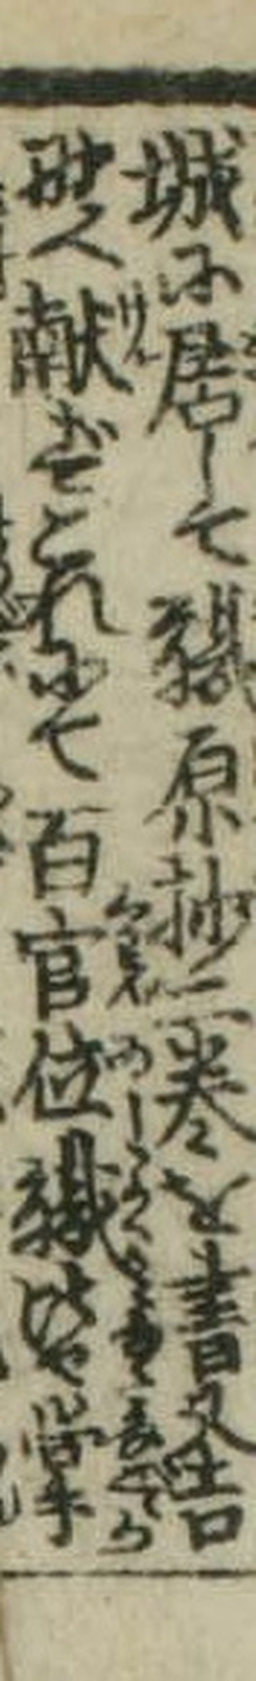野へ献ずこれにて百官位職皆掌
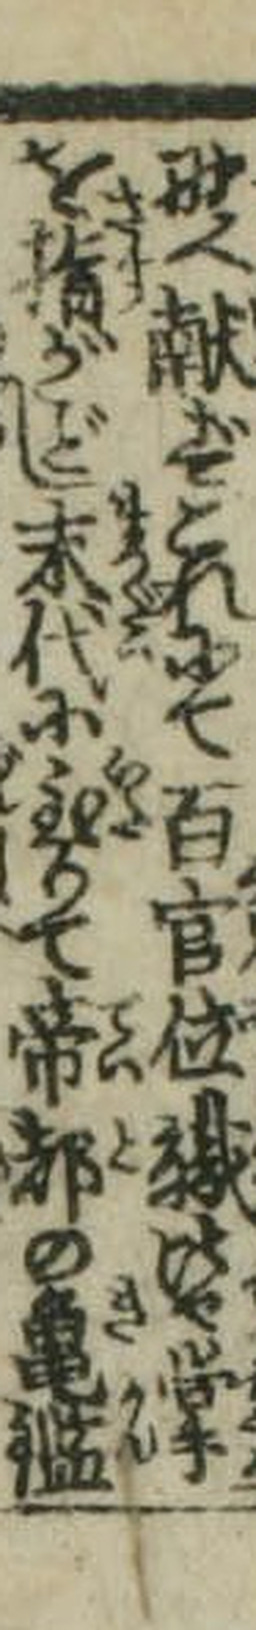を指がごとし末代に至りて帝都の亀鑑
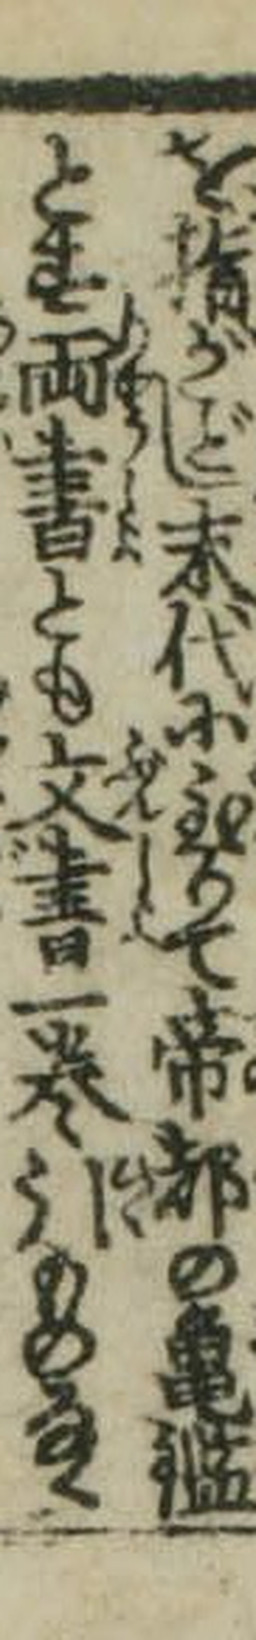とす両書とも文書一巻引ものなく
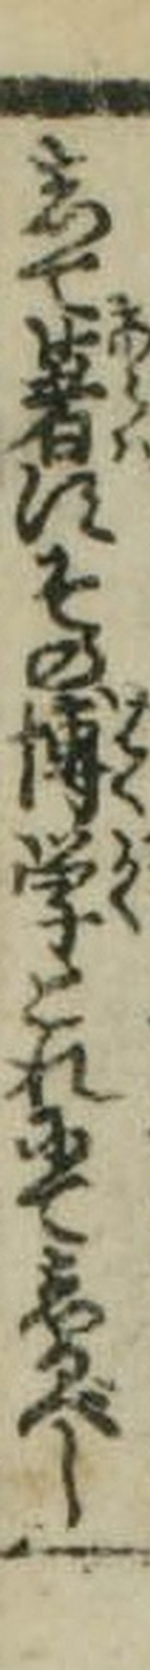して著すその博学これにてしるべし
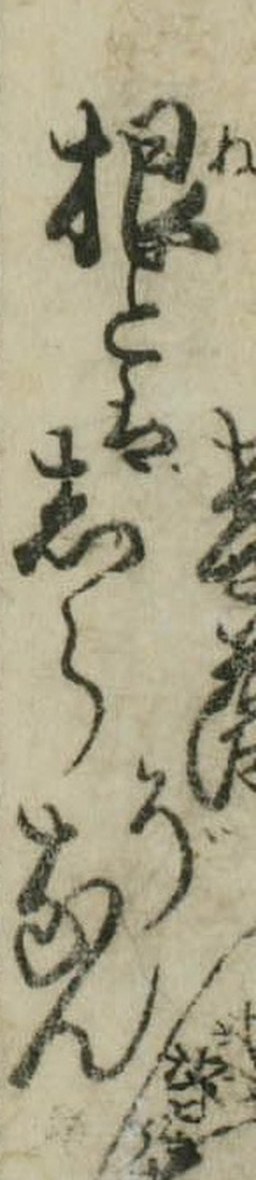根とはしらなん
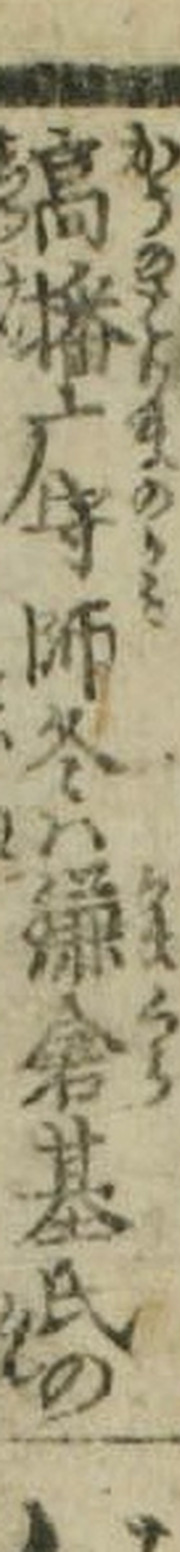高播磨守師冬は鎌倉基氏の
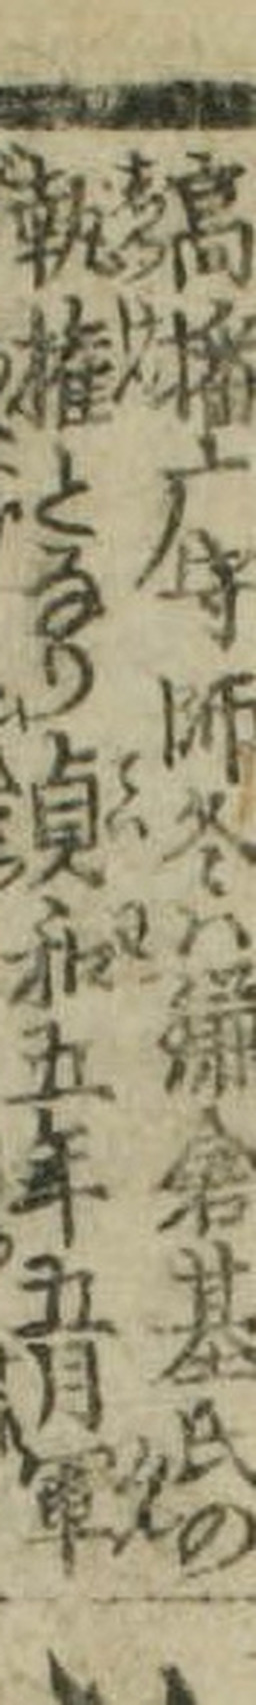執権となり貞和五年五月軍
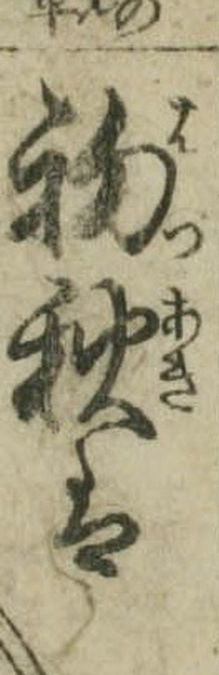初秋は
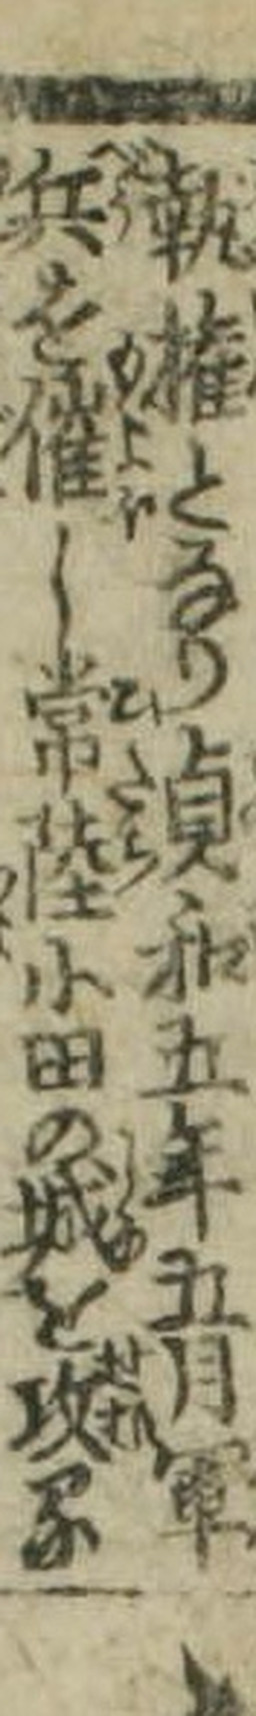兵を催し常陸小田の城を攻る
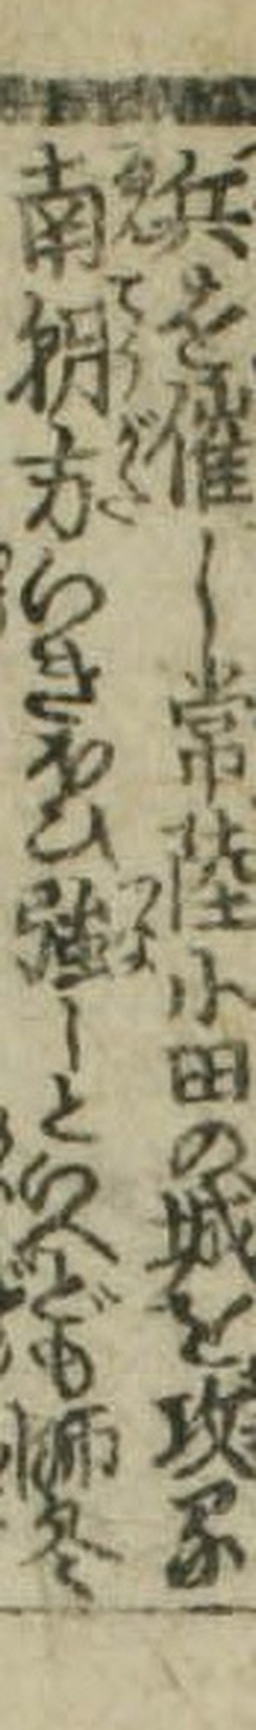南朝方いきほひ強しといへども師冬
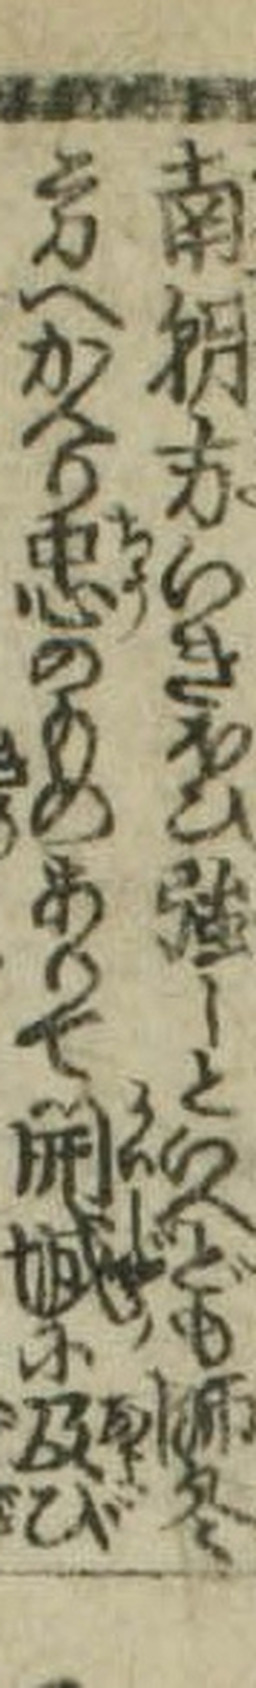方へかへり忠のものありて開城に及び
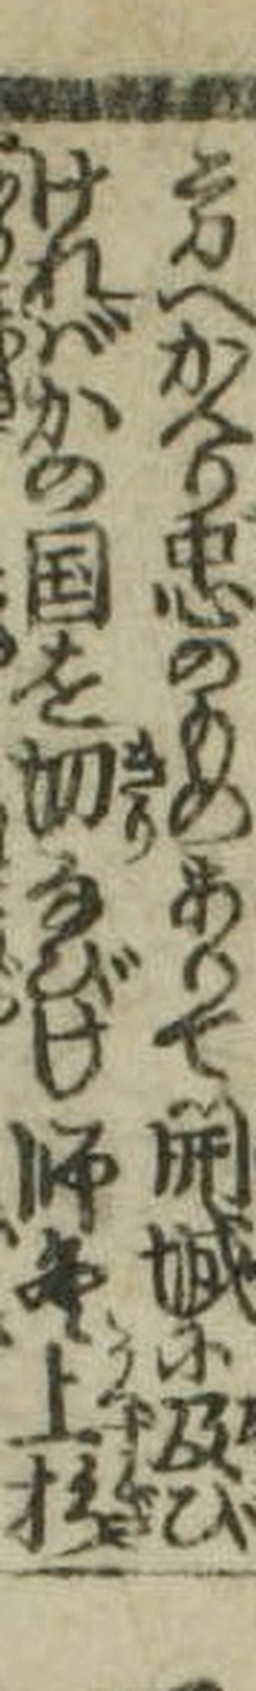ければかの国を切なびけ師冬上杉
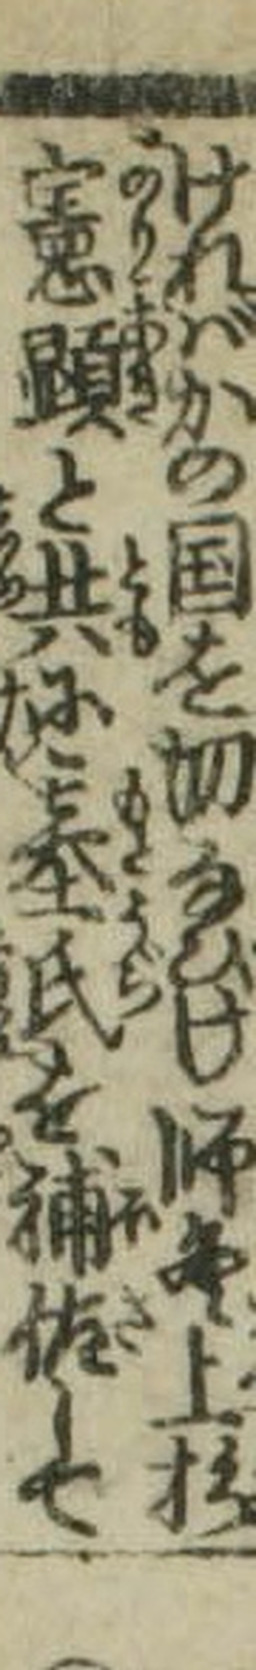憲顕と共に基氏を補佐して
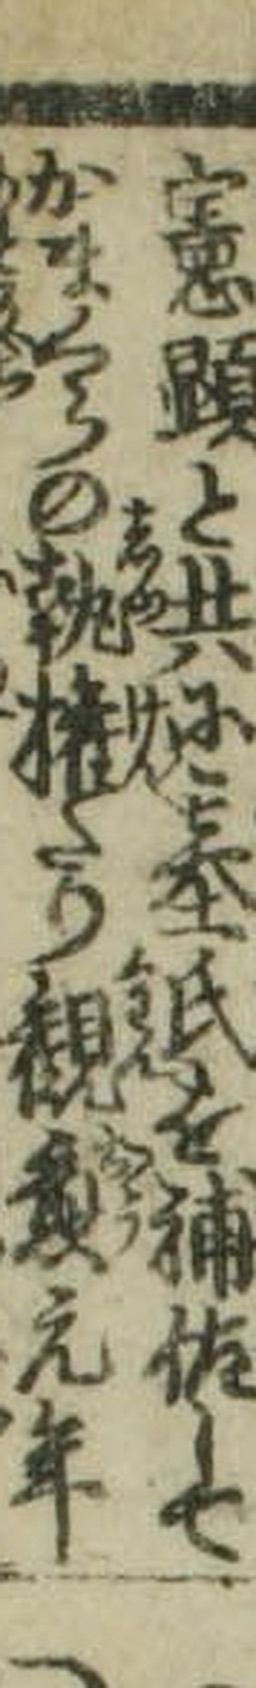かまくらの執権たり観応元年
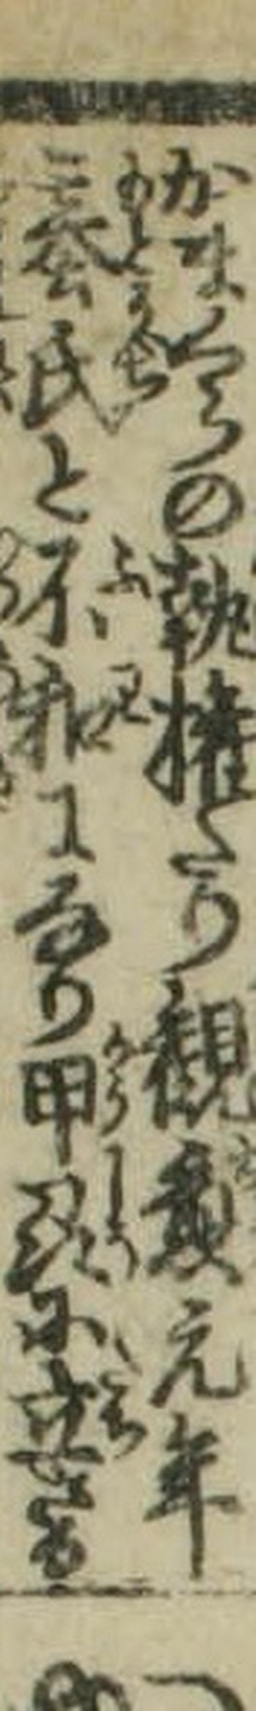基氏と不和になり甲州に立さる
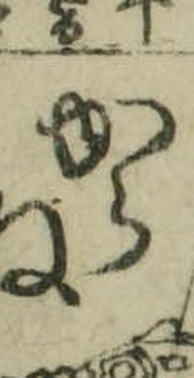からぬ
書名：續英雄百人一首
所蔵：東京学芸大学附属図書館
